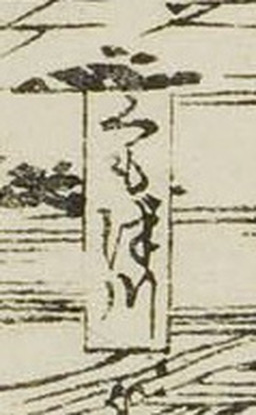くもづ川
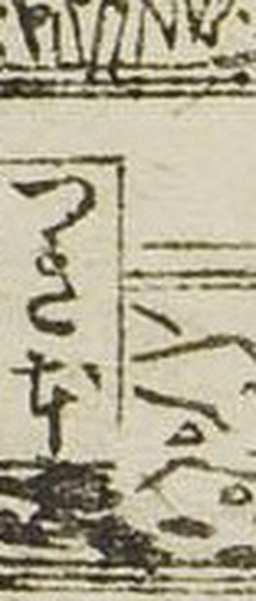つき本
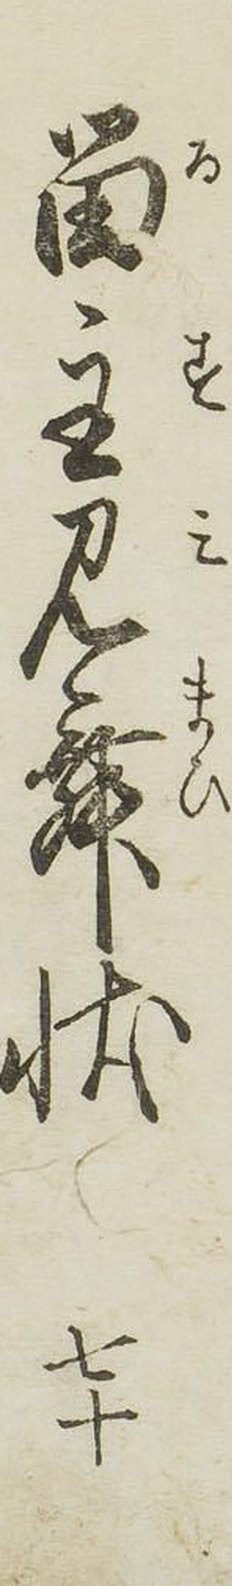留主見舞状七十
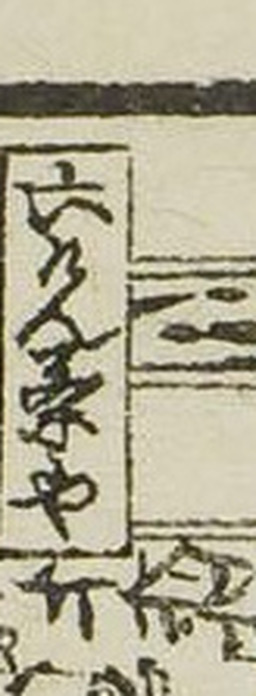六けん茶や
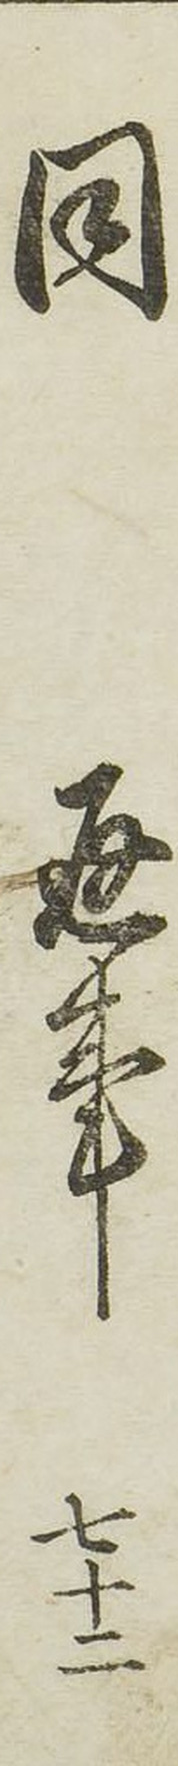同返事七十二

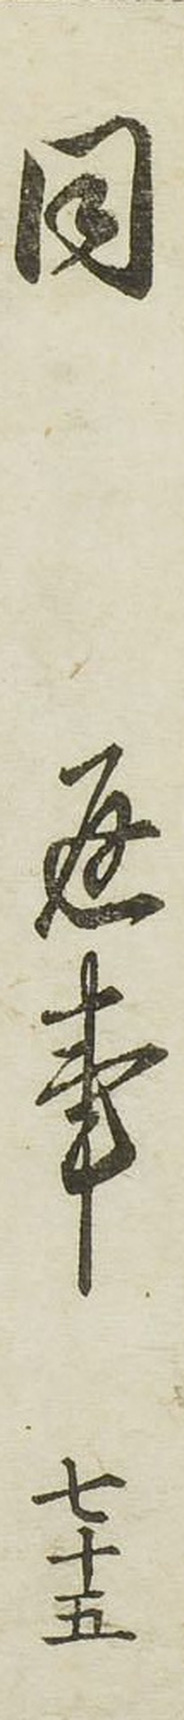同返事七十五
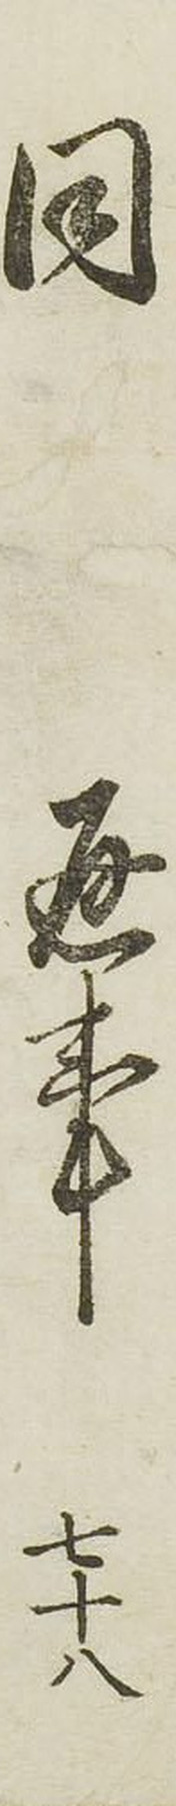同返事七十八
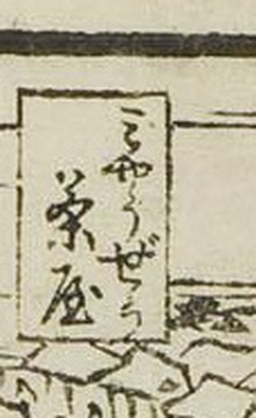みやうぜう
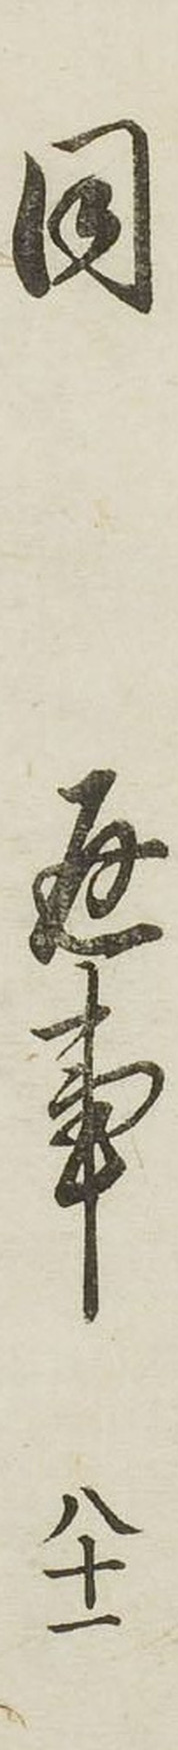同返事八十一
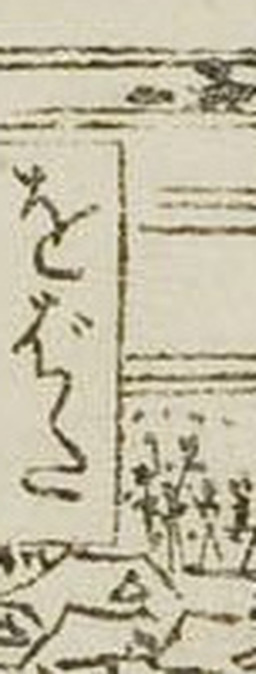をばた
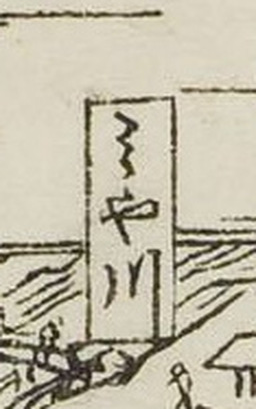みや川
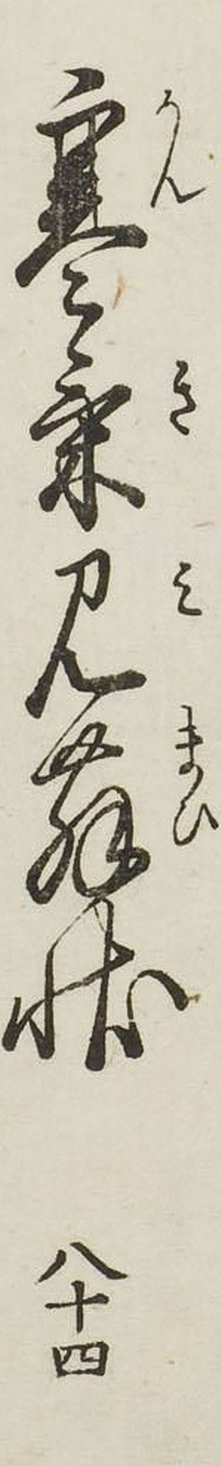寒気見舞状八十四
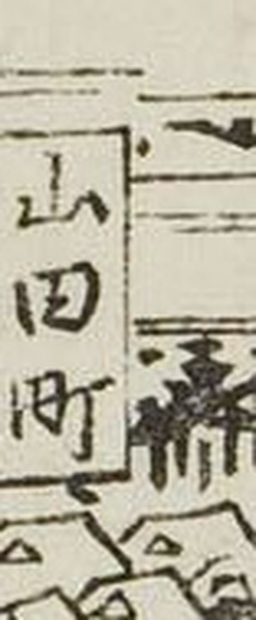山田町
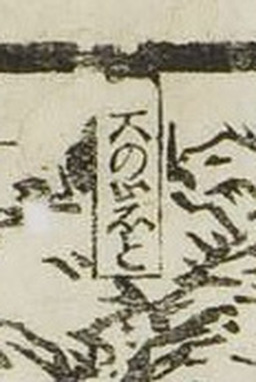天の岩と
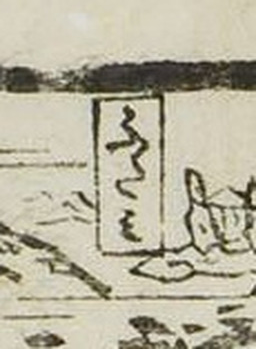ふたみ
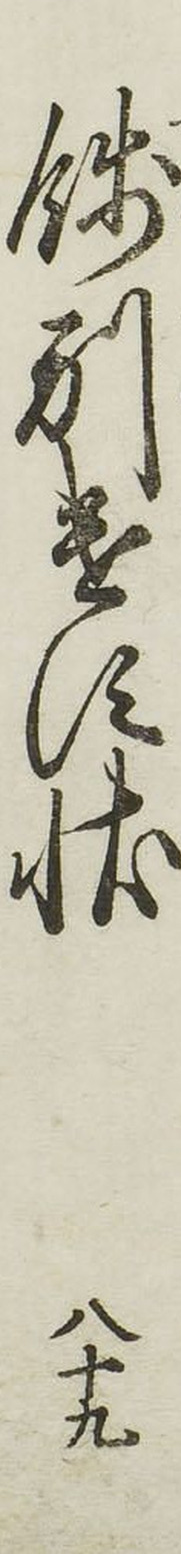餞別遣す状八十九
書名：商人書翰便覧
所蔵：東京学芸大学教育コンテンツアーカイブ
